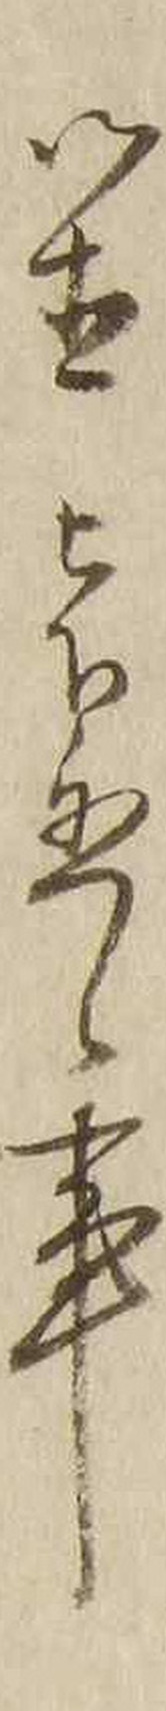御直被下置候事

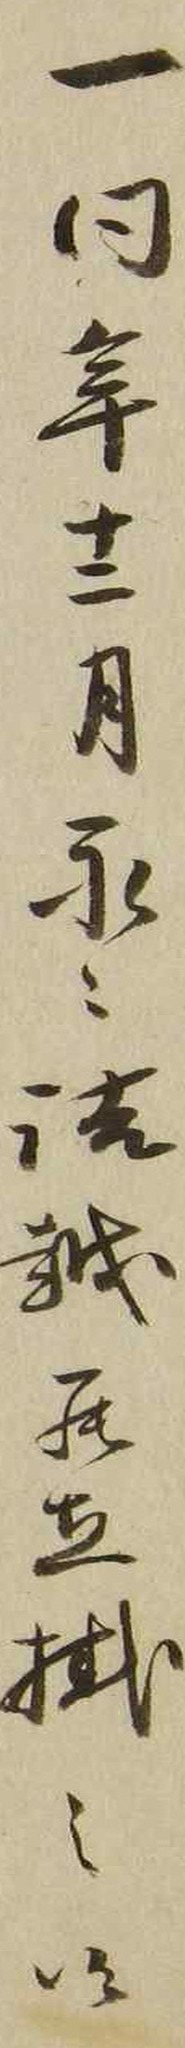一同年十二月永々詰越罷在職之御
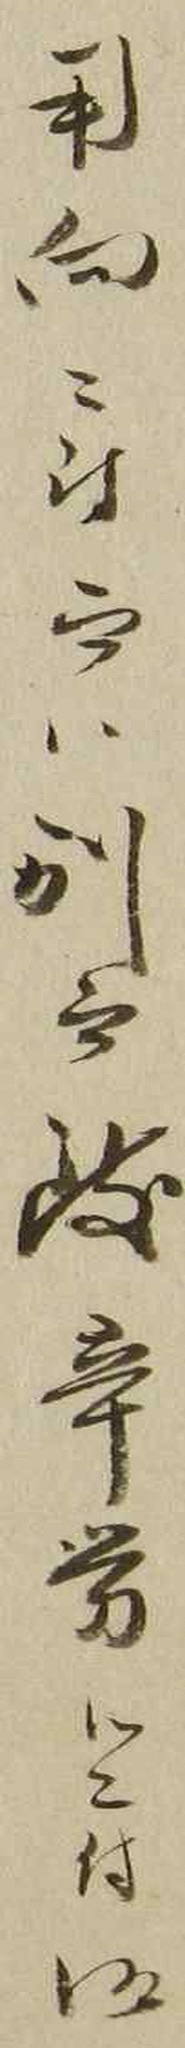用向に付而は別而致辛労候に付御
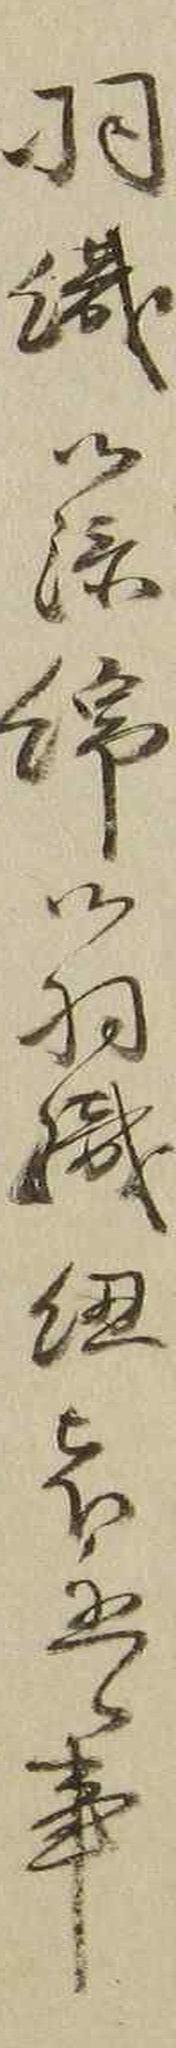羽織御添綿御羽織紐被下置候事
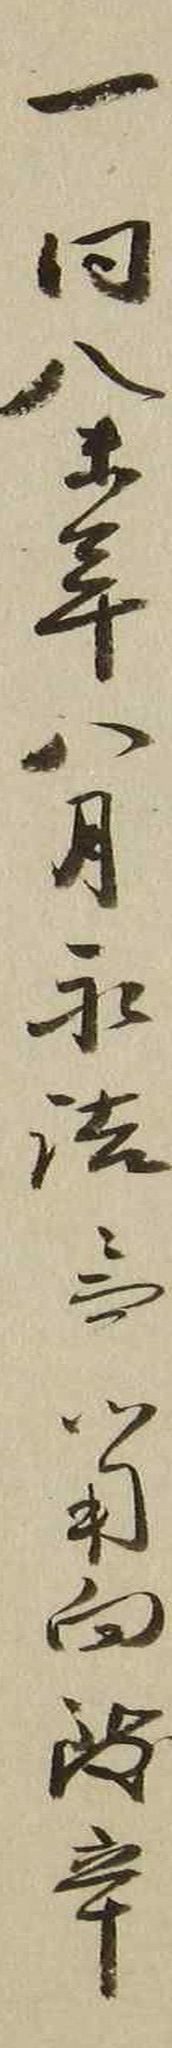一同八未年八月永詰に而御用向致辛
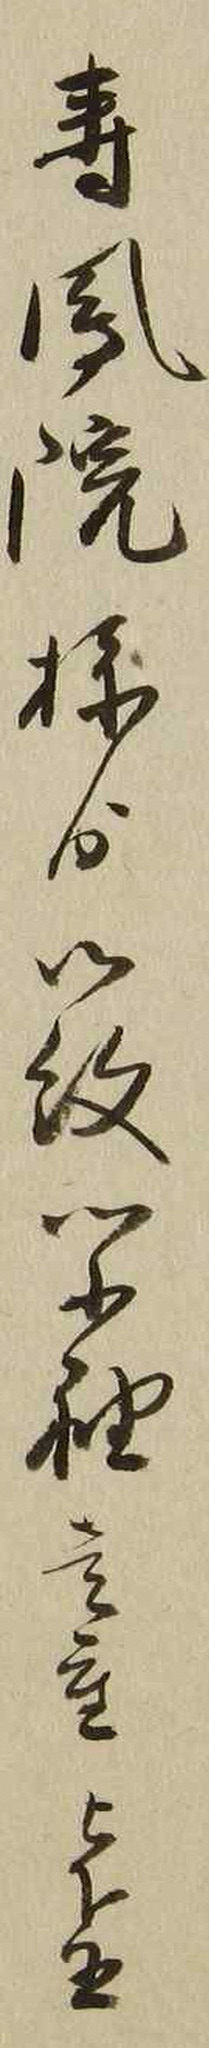寿鳳院様ゟ御紋御小袖壱重被下置
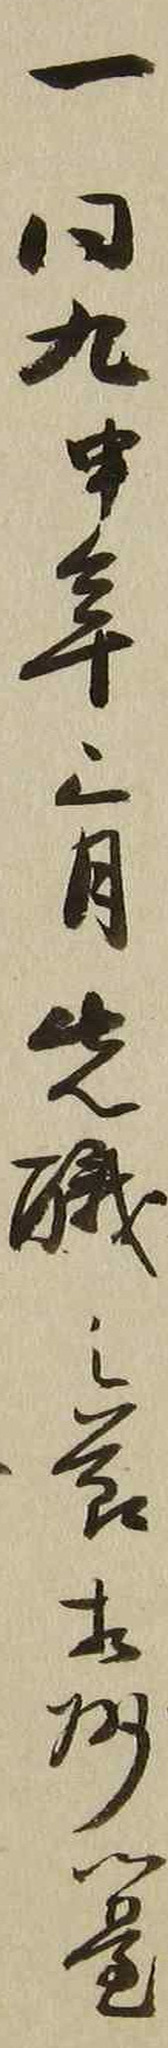一同九申年三月先職之節相州御台
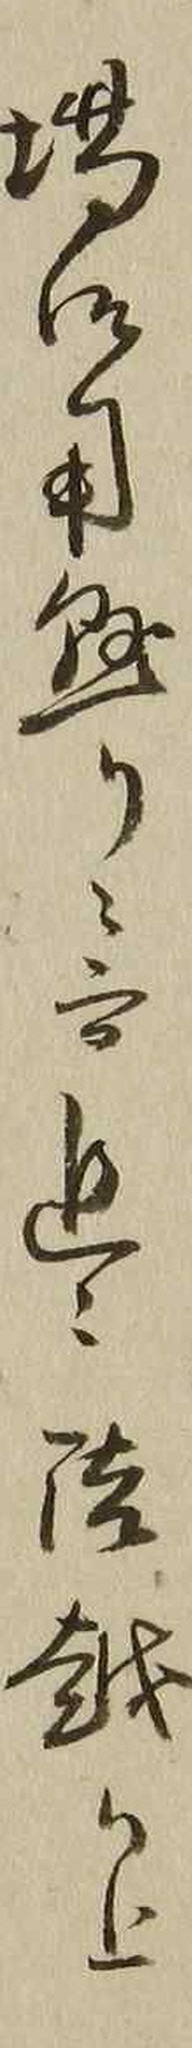場御用懸りに而追々詰越候上
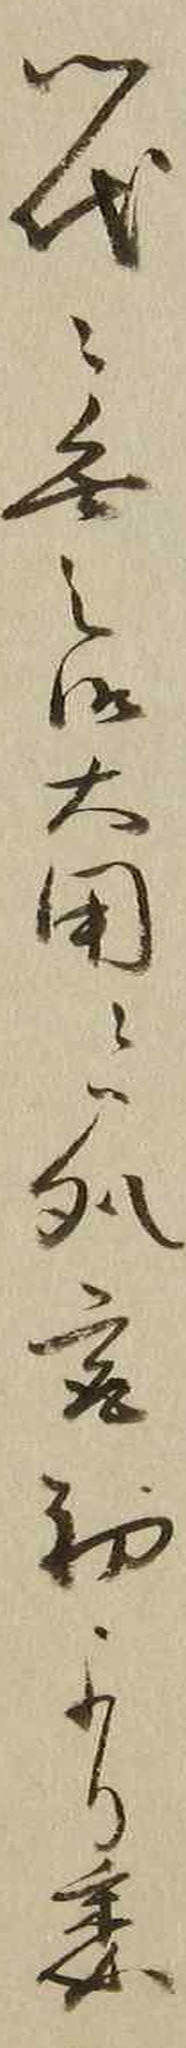御代々無之大用に候処最初より乗役
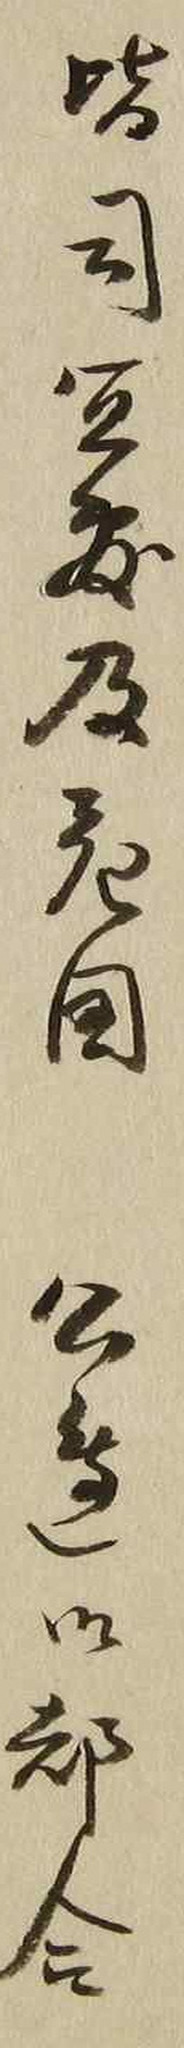皆司宜敷及差図公辺御都合
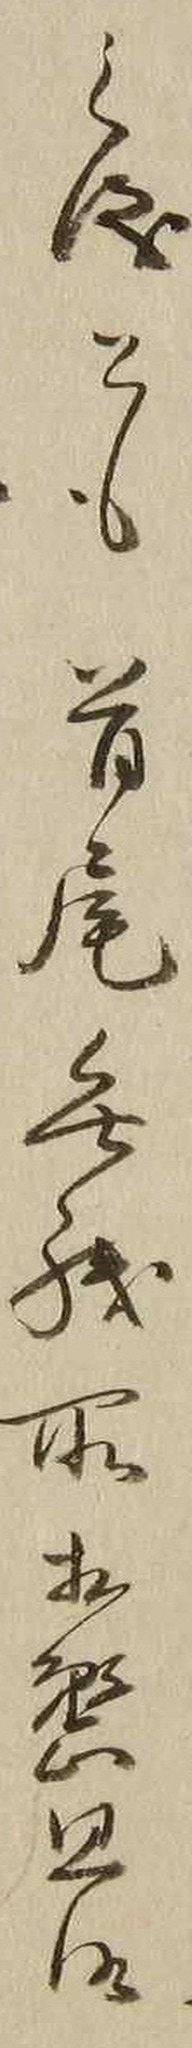之儀とも首尾無残所相整且御
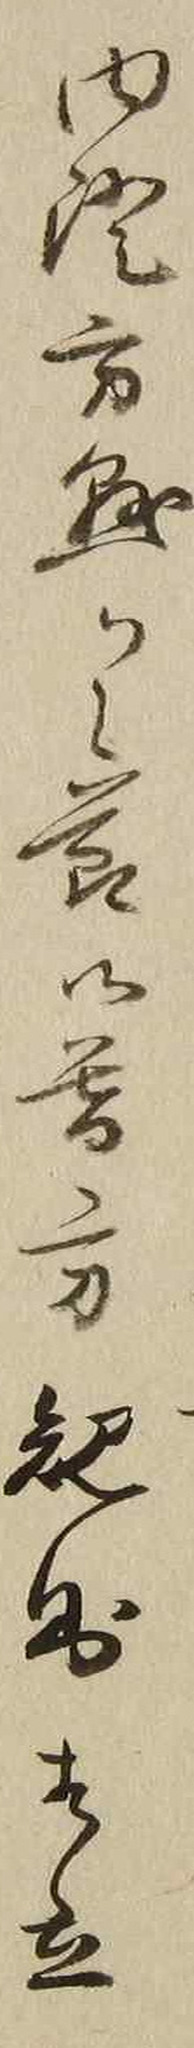内証方懸り之節御暮方規則相立
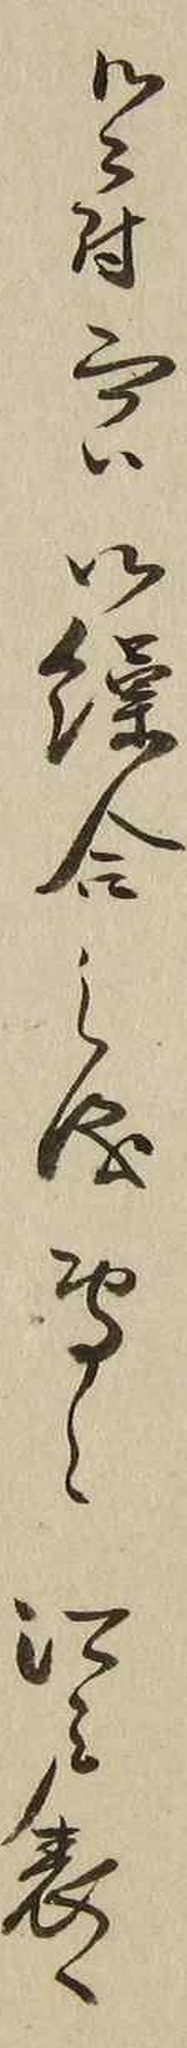候に付而は御繰合之儀守候江戸表へ
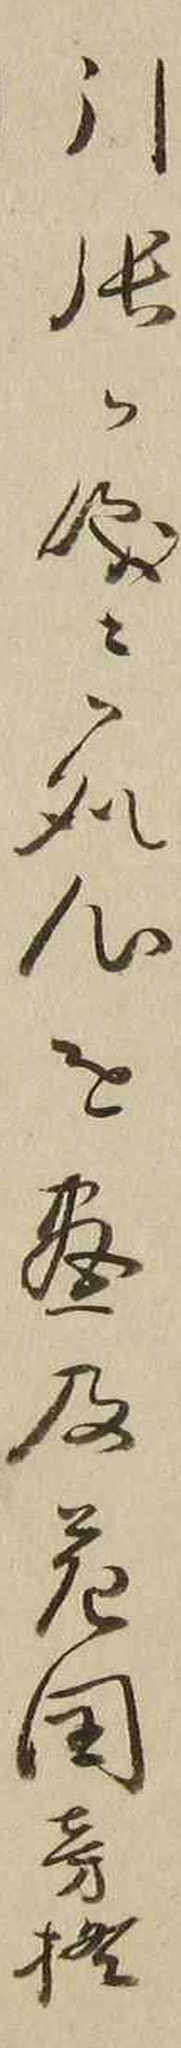引張候儀に候処心を懸及差図旁格
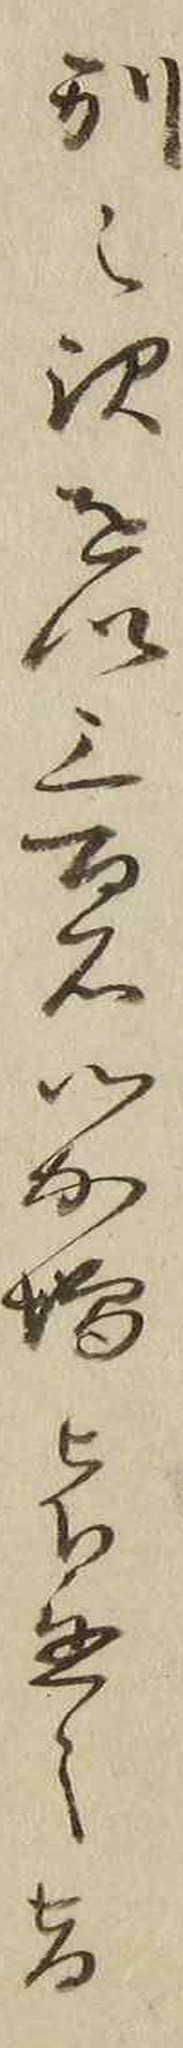別之儀を以三百石御加増被下置候旨
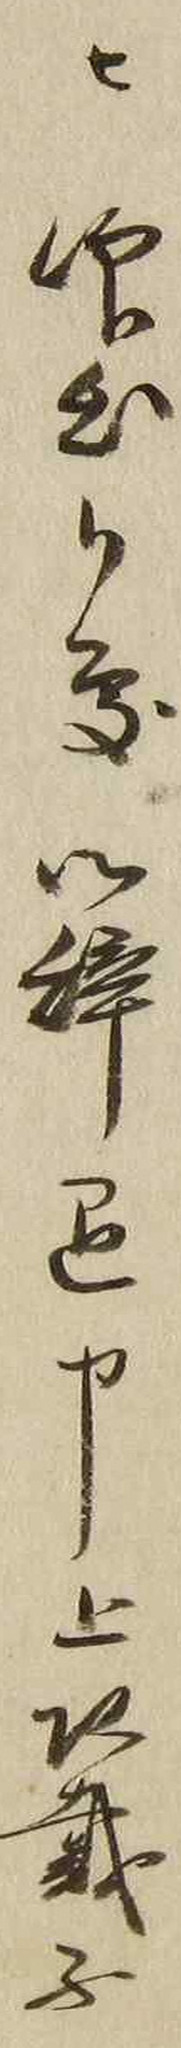被仰出候処御辞退申上頂戴不
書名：諸士系譜　巻之269　さ之部1
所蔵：会津若松市立会津図書館
